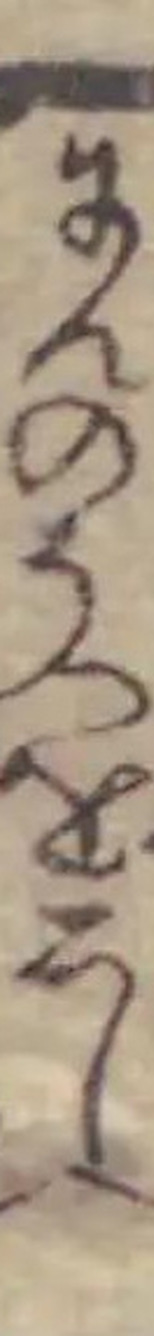にんのうへをこし
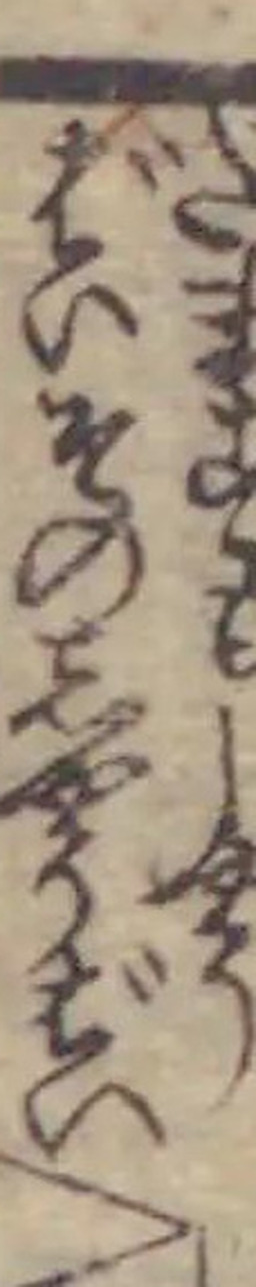ばいそのしやうばい
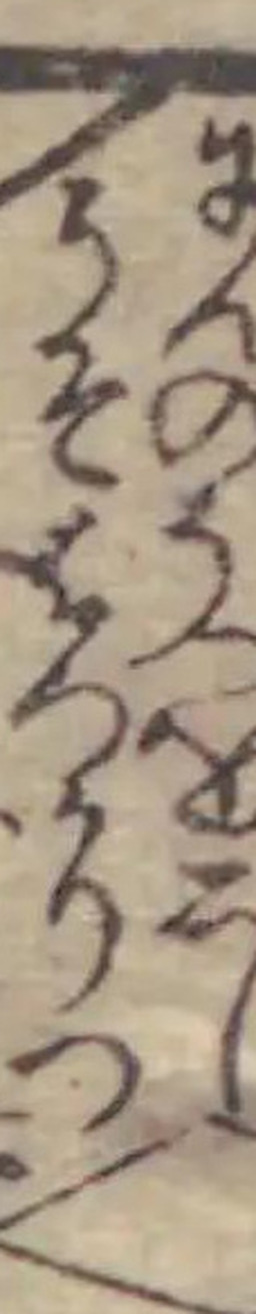うそはつかりつ
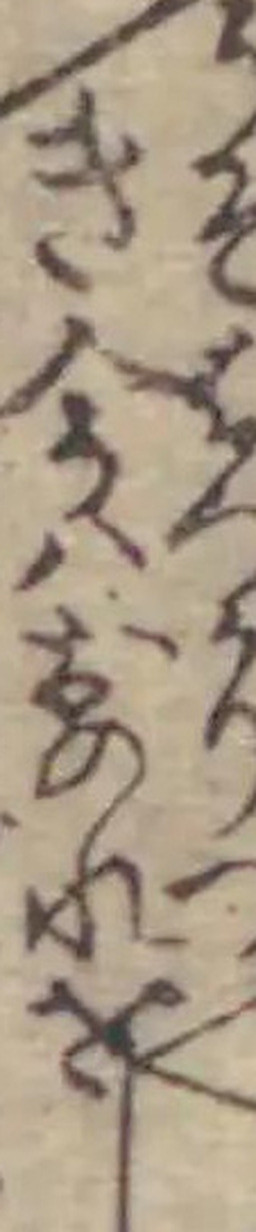き今はおのれを
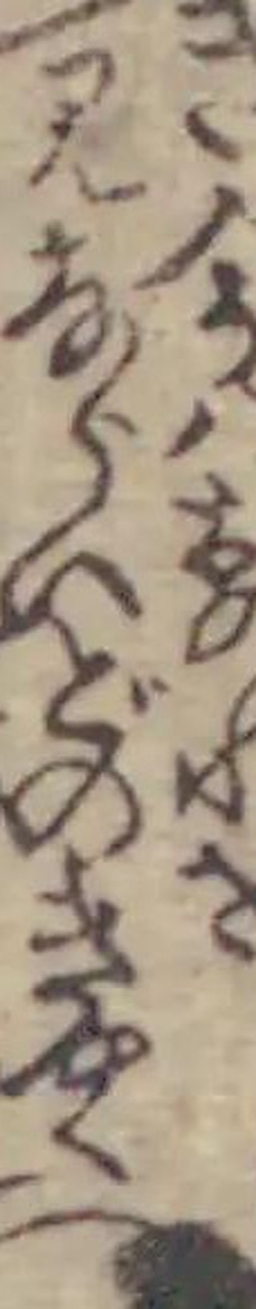見ならいどのきやく
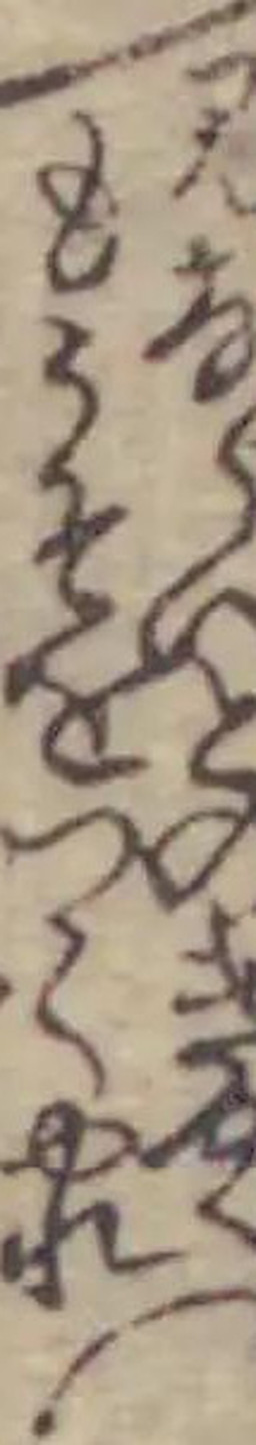もうそをつくやれ
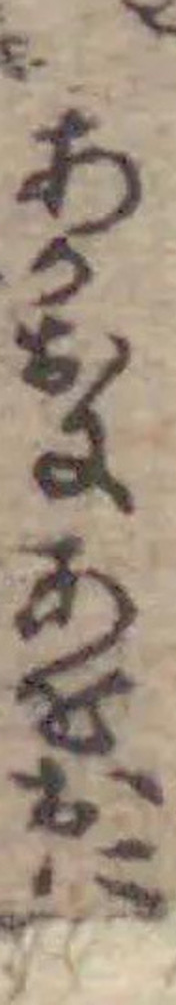あかおにあをおに
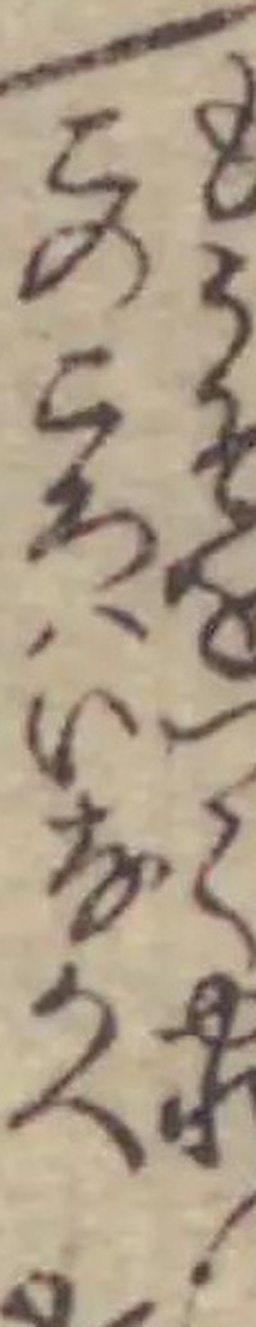このころはいなかへ
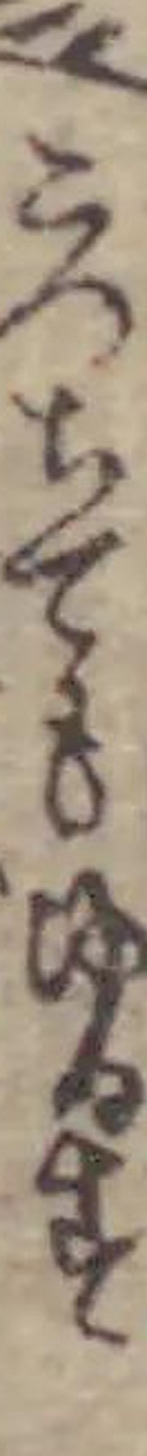こつちてもゆるす
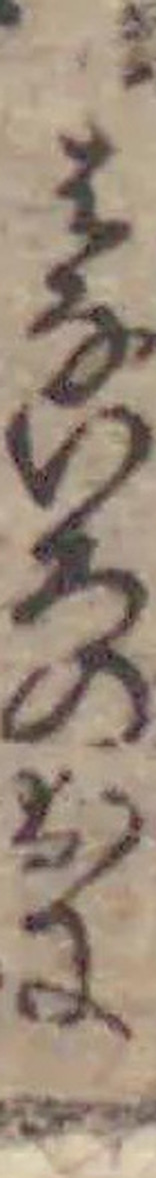はないろのおに
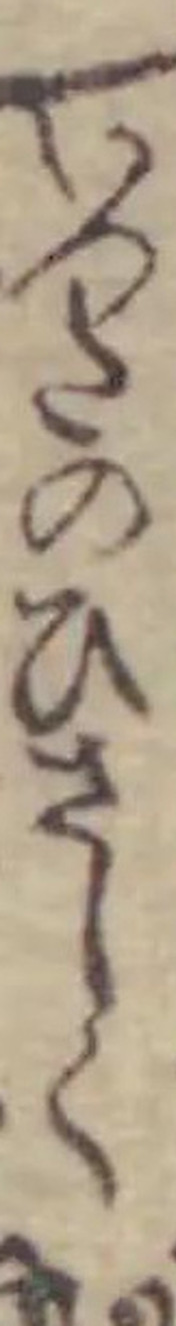いつたのひさしく
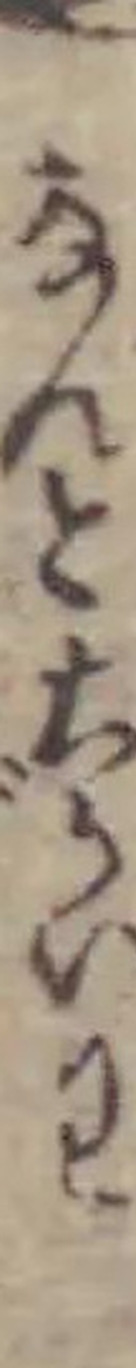なんとちかいわ
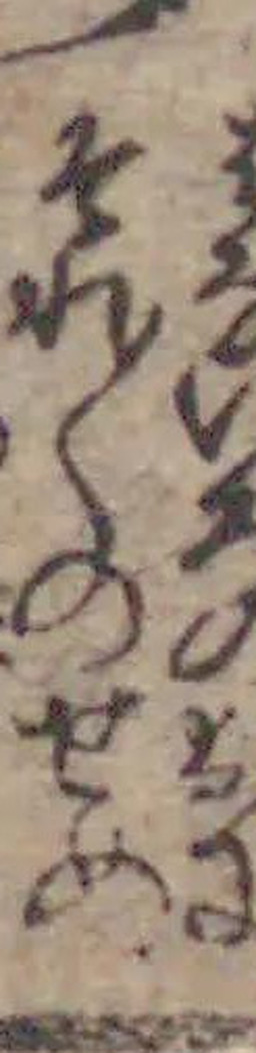それ〳〵のせめ
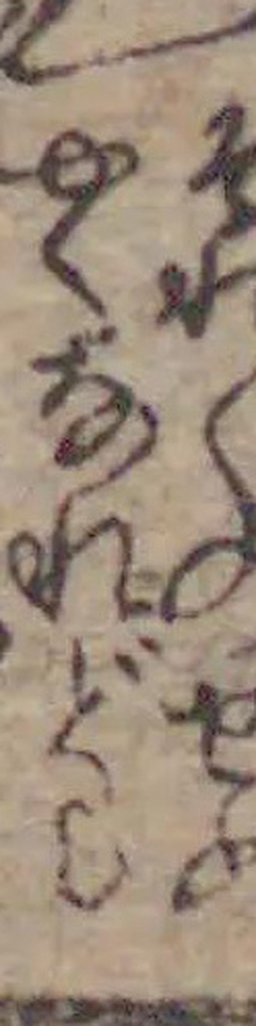やくなれども
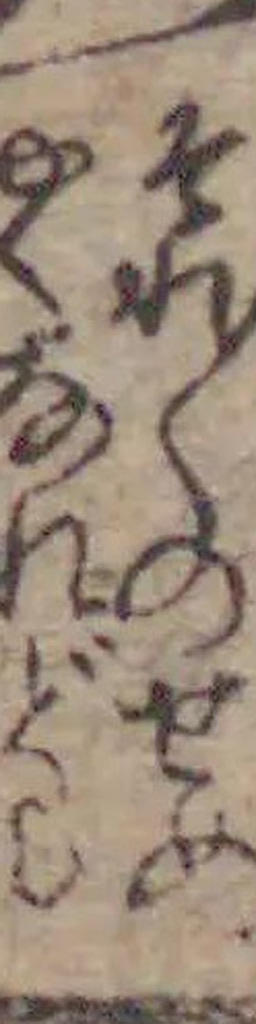やくなれども
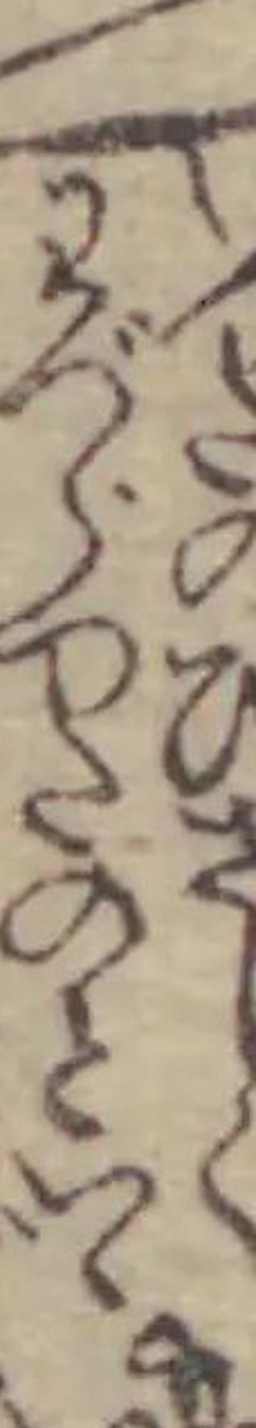わづらつたのといゝ
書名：虚言弥二郎傾城誠 3巻
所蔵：国立国会図書館 National Diet Library, JAPAN
